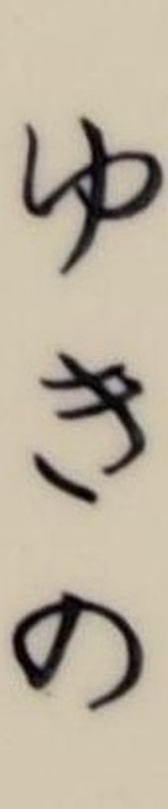ゆきの
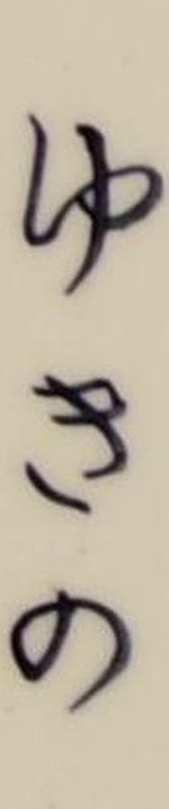ゆきの
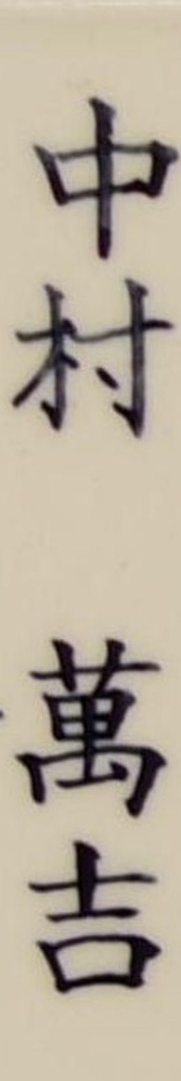中村万吉

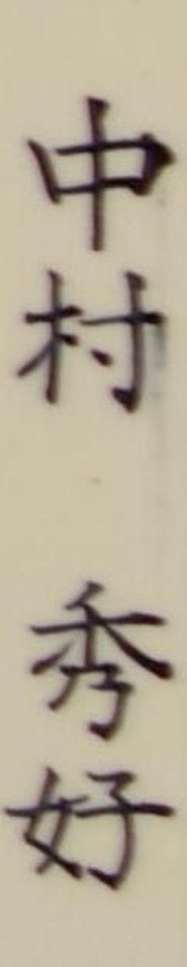中村秀好
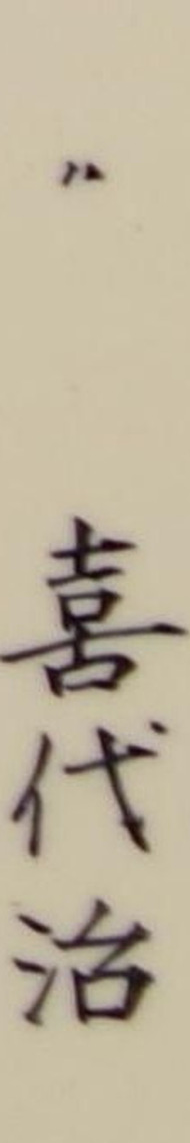喜代治
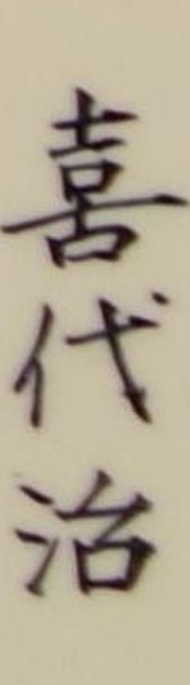喜代治
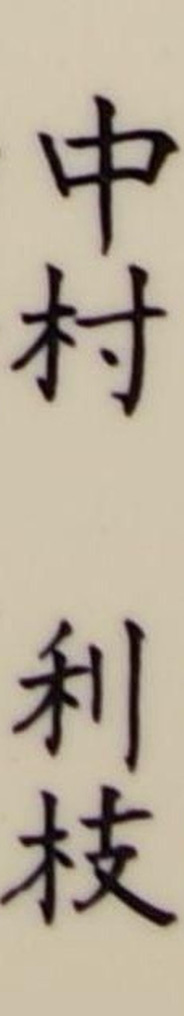中村利枝
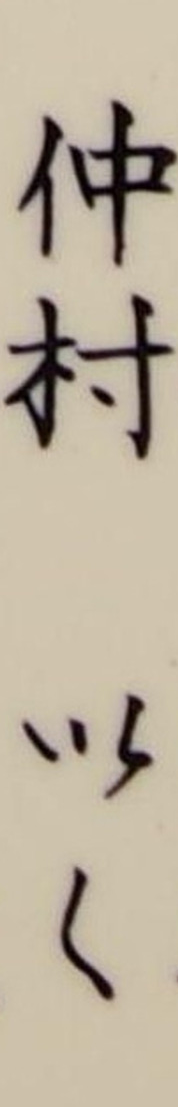仲村いく
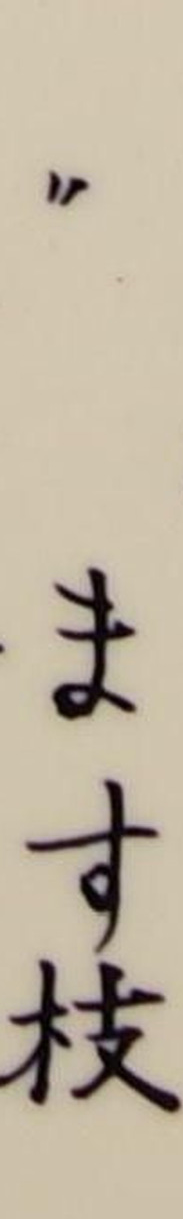ます枝
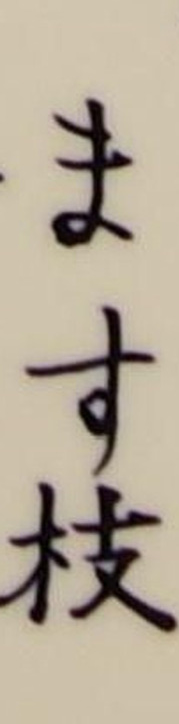ます枝
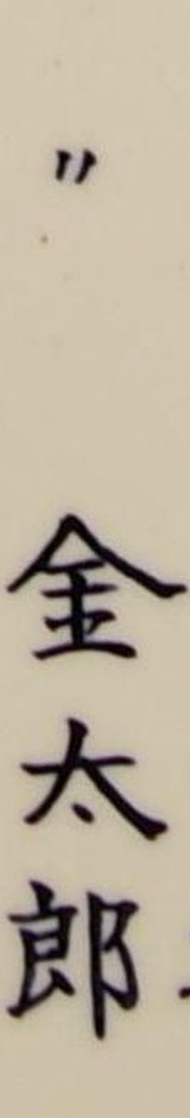金太郎
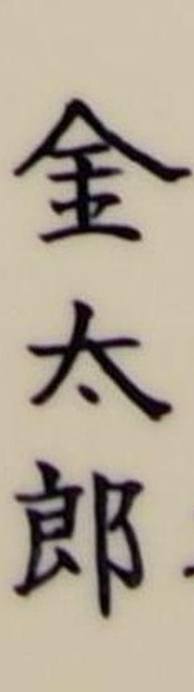金太郎
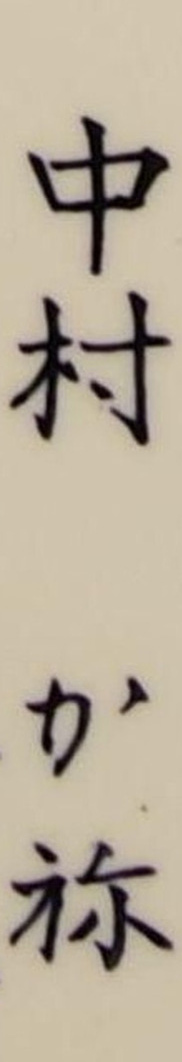中村かね

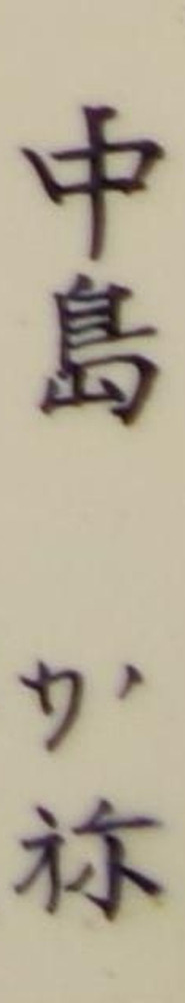中島かね
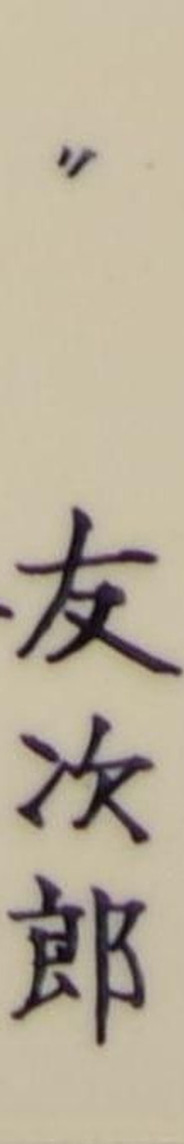友次郎
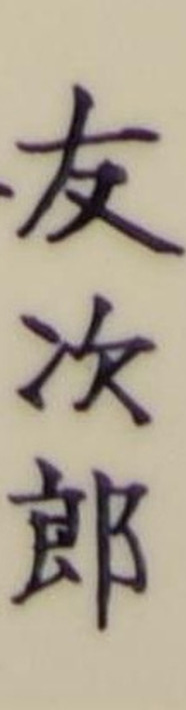友次郎
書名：A~D
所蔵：koyasan kongobuji
